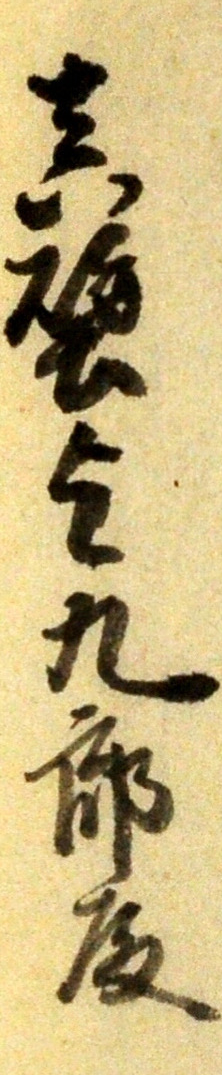真壁与九郎殿
